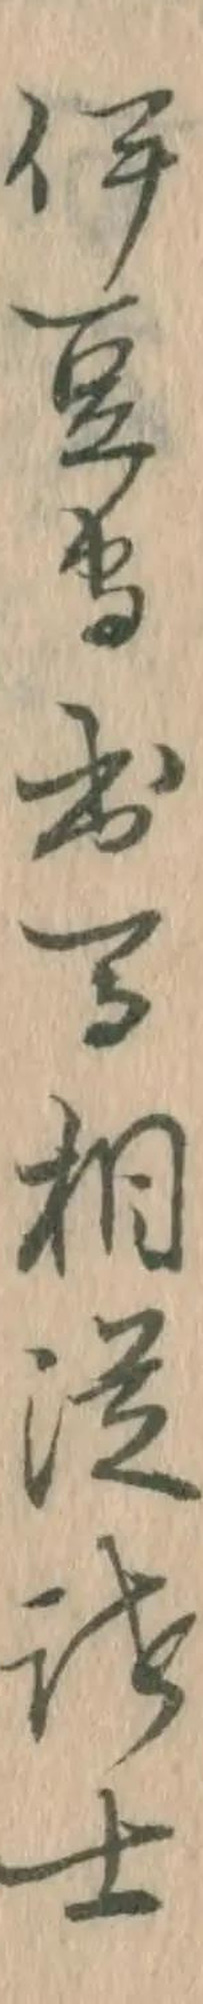伊豆守出馬相従諸士
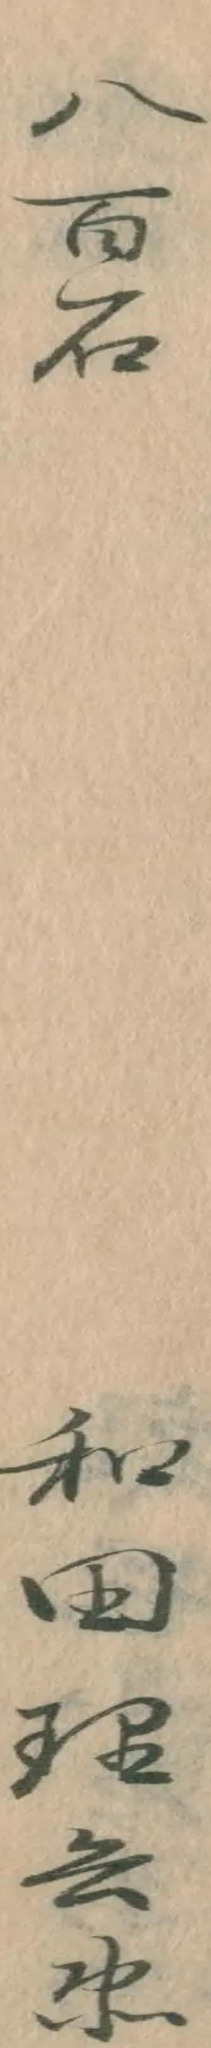八百石和田理兵衛
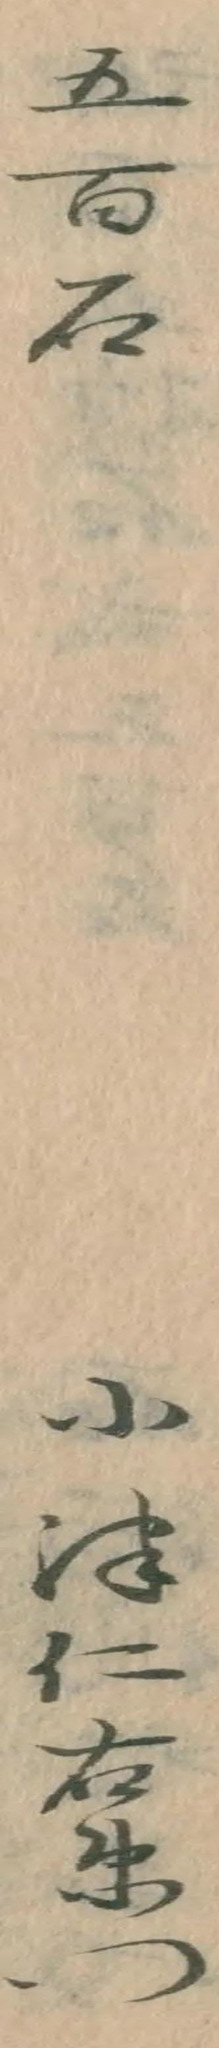五百石小津仁右衛門
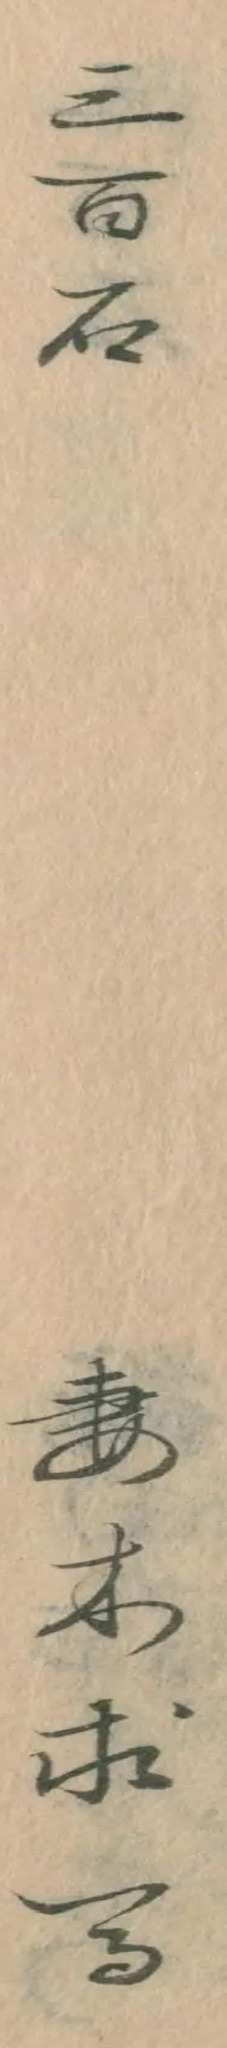三百石妻木求馬

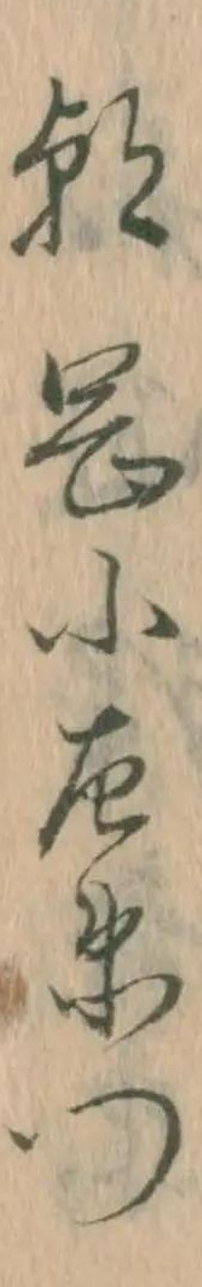朝岡小左衛門

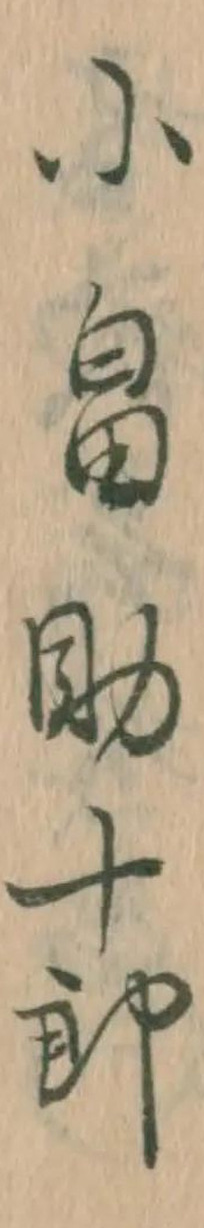小畠助十郎

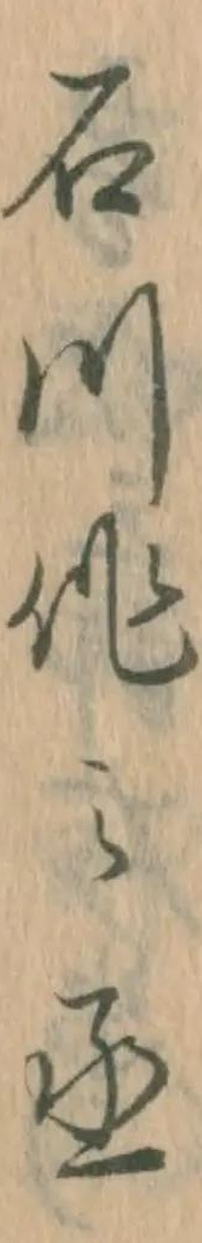石川作之丞
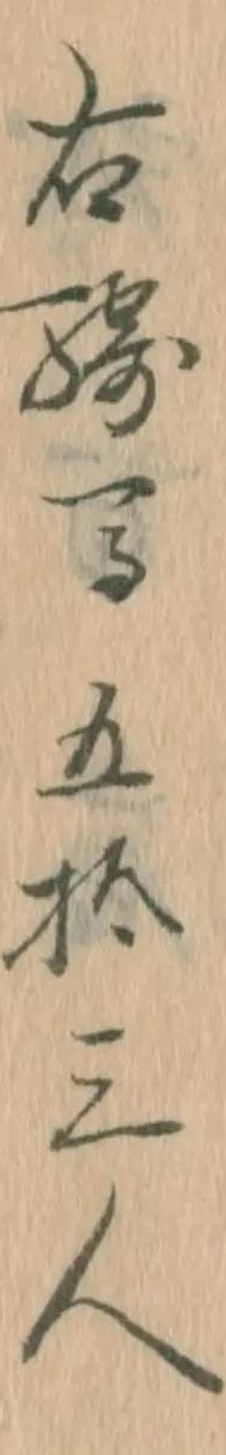右騎馬五拾三人
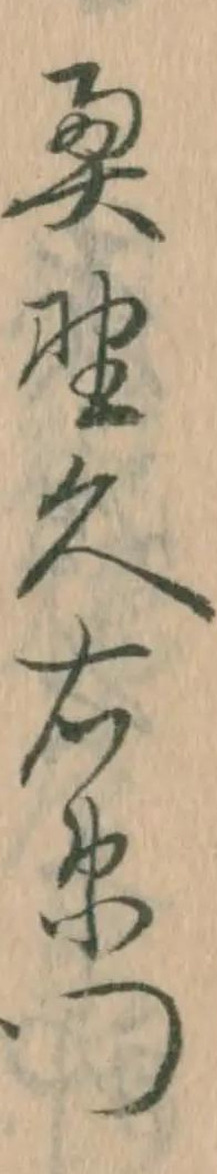奥野久右衛門
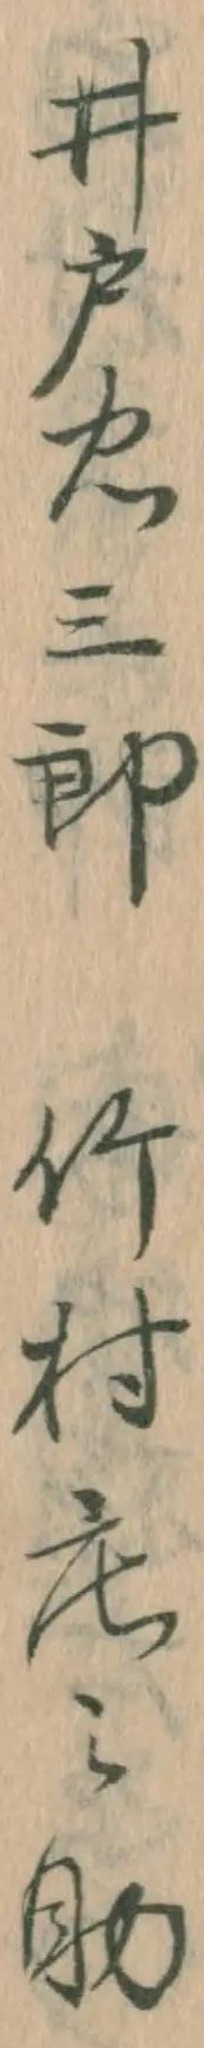井戸忠三郎竹村庄之助
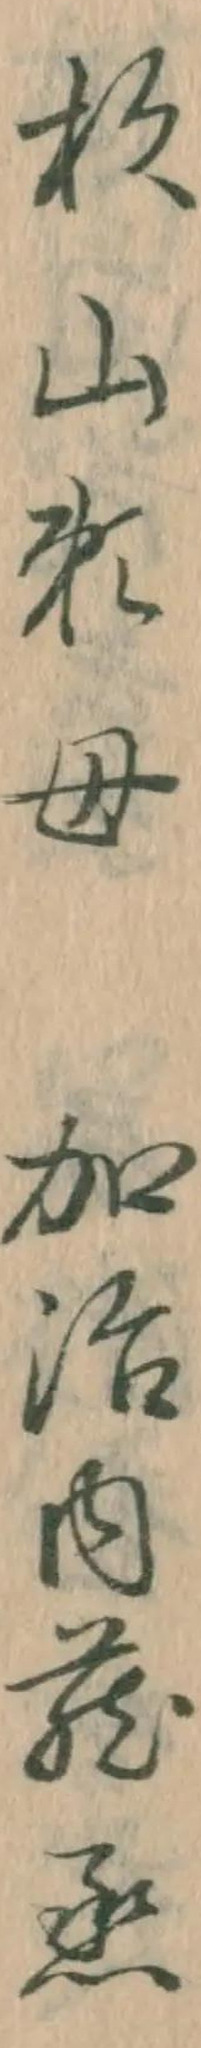杉山頼母加治内蔵丞
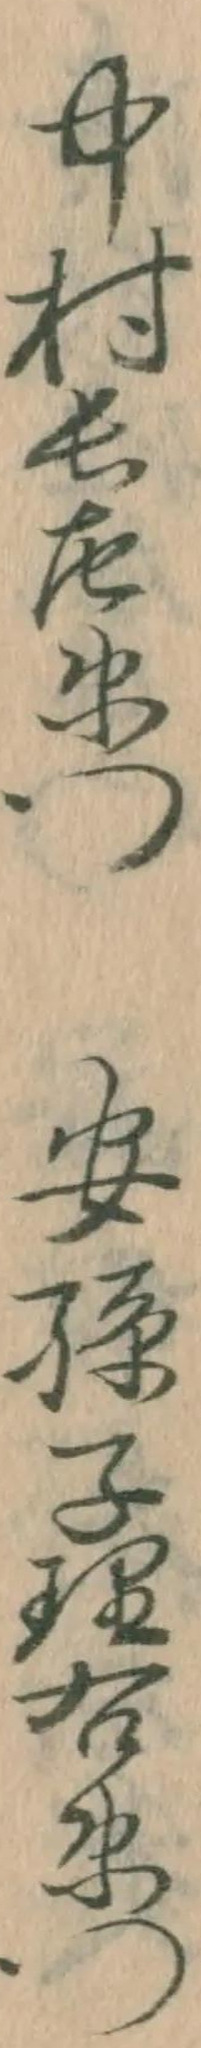中村長左衛門安孫子理右衛門
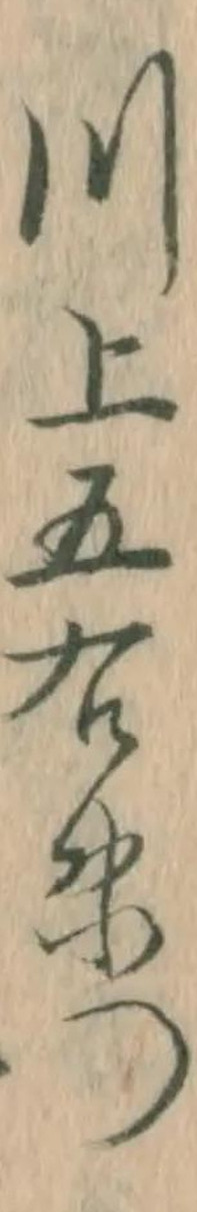川上五右衛門
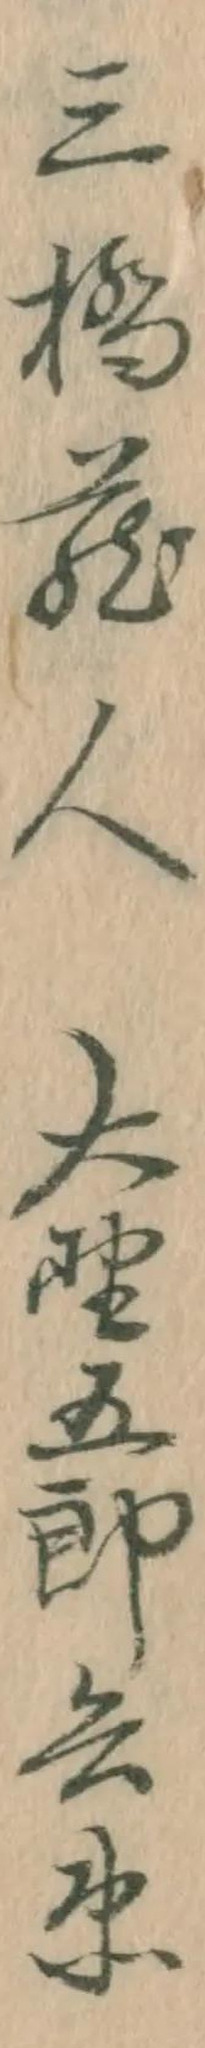三橋蔵人大野五郎兵衛
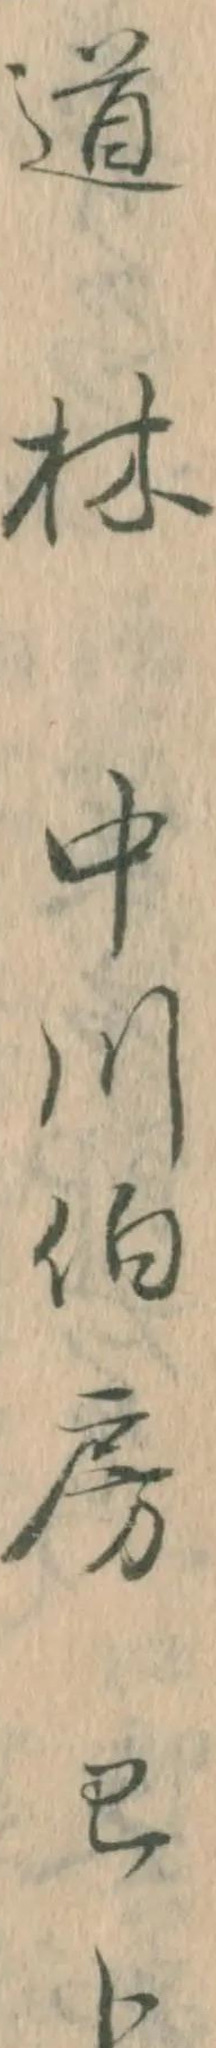道林中川伯房已上
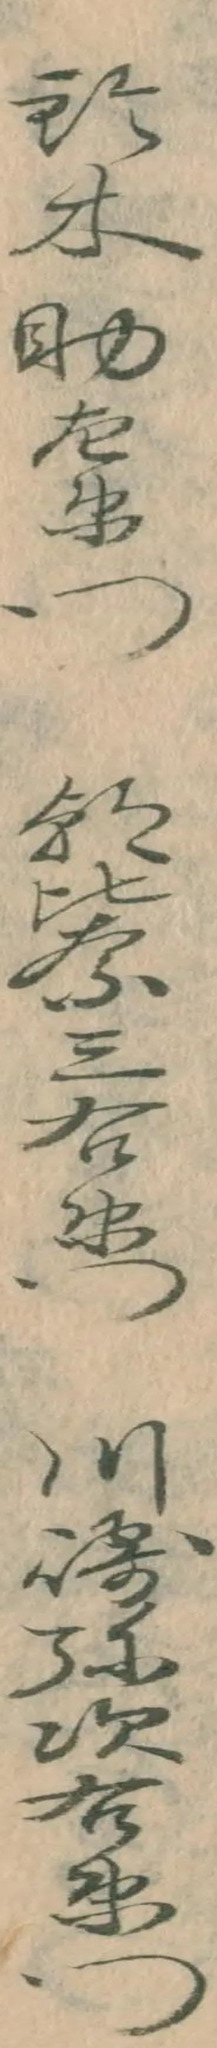鈴木助左衛門朝比奈三右衛門川崎弥次右衛門
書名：切支丹御退治記 49巻. [3]
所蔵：国立国会図書館 National Diet Library, JAPAN
